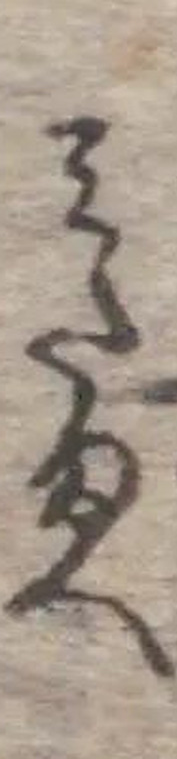みたまへ

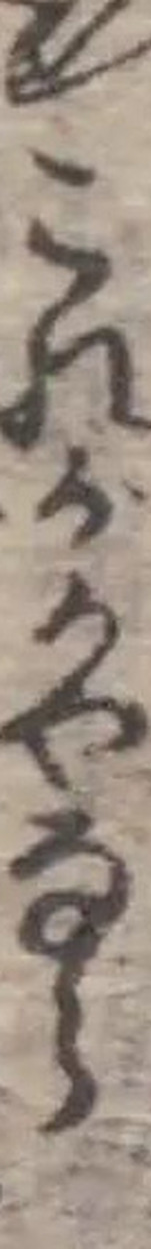これかかやなら
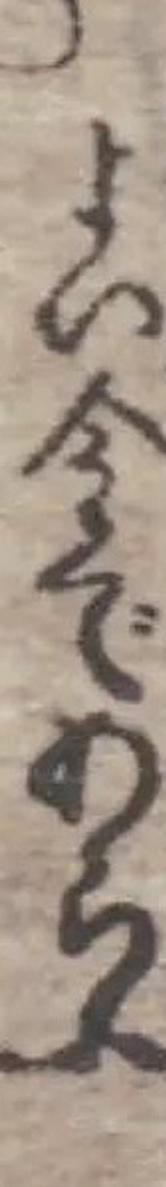よい金であらふ
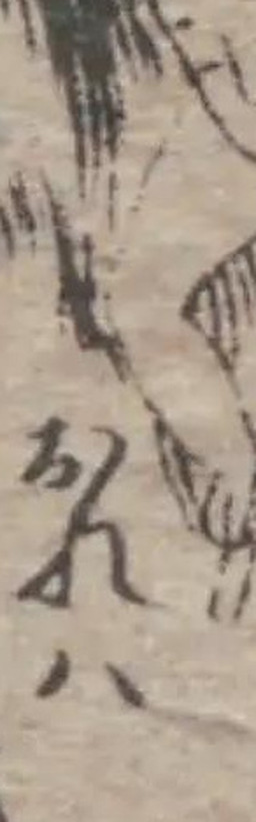おれは
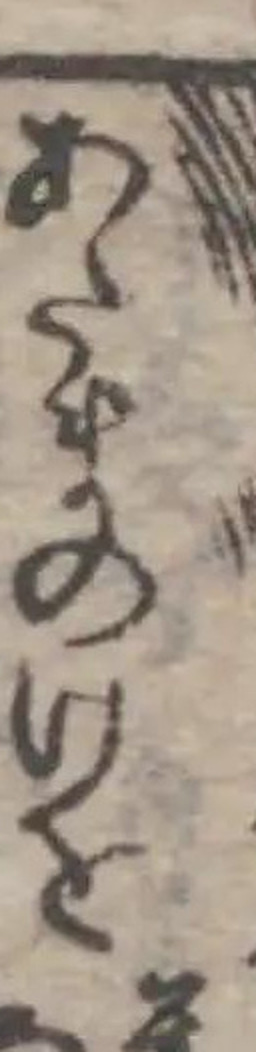あたまのけを
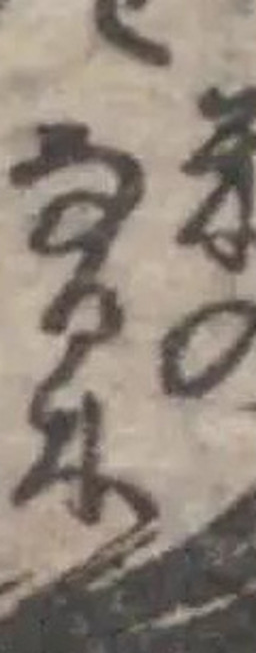なる木
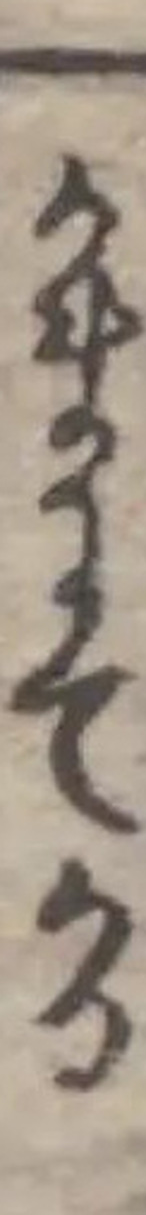かまにてかる
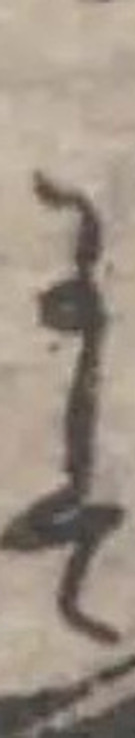にして
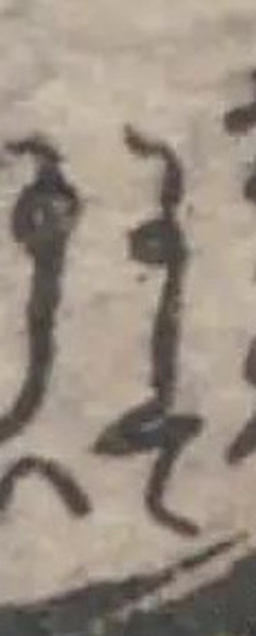おれは
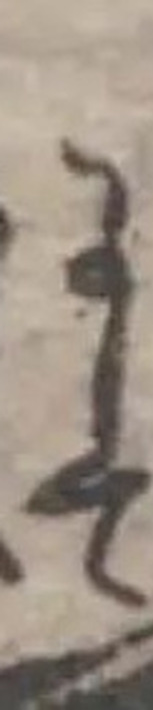にして
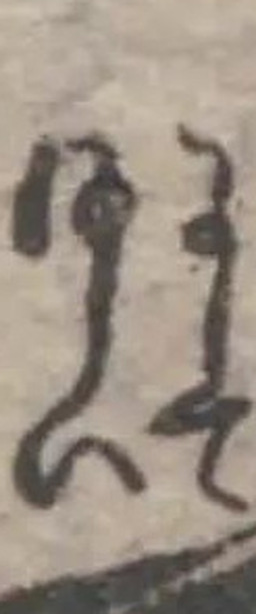ほしい
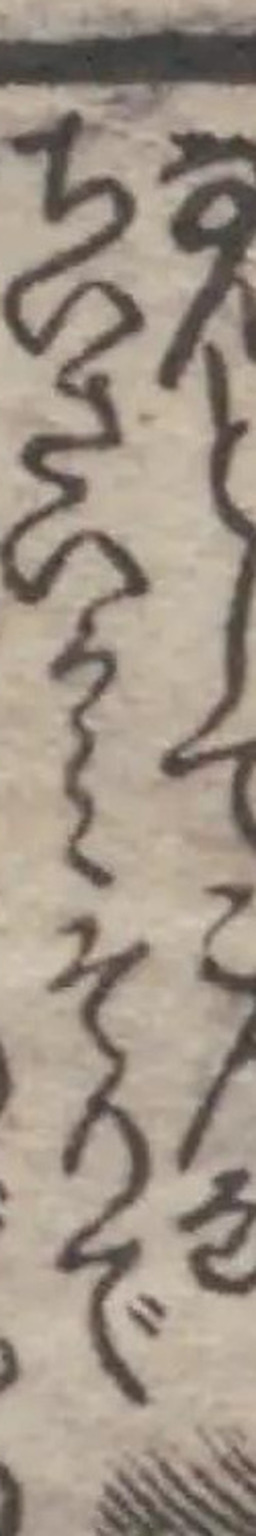ちいさいかみそりで
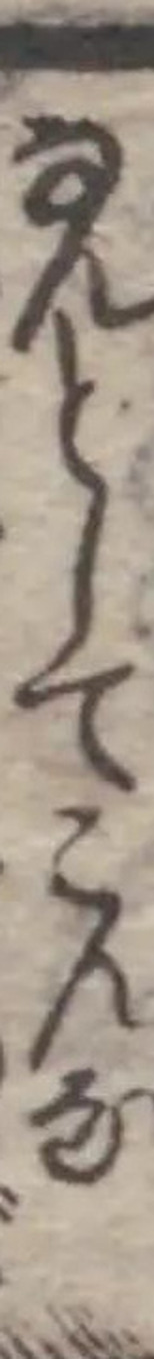なんとしてこんな
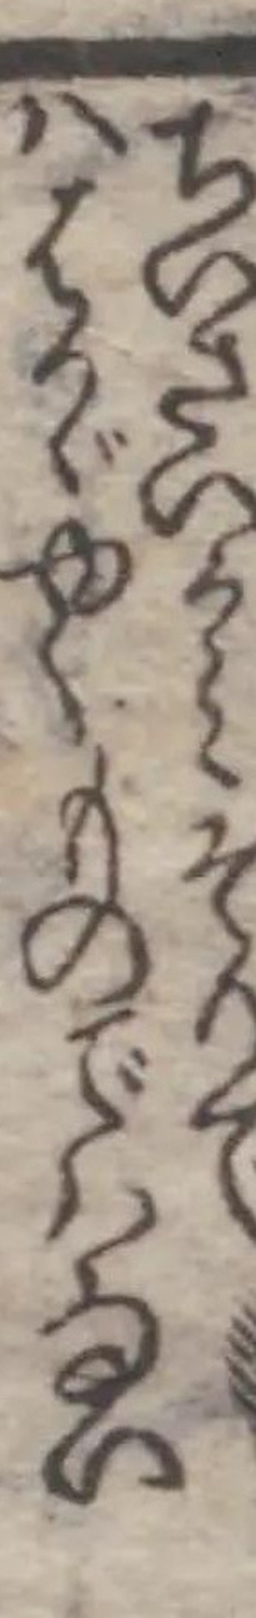ははかゞゆくものではない
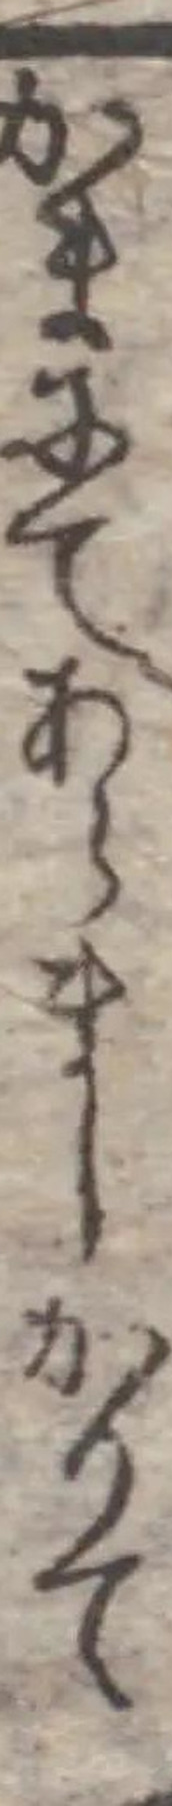かまにてあらましかりて
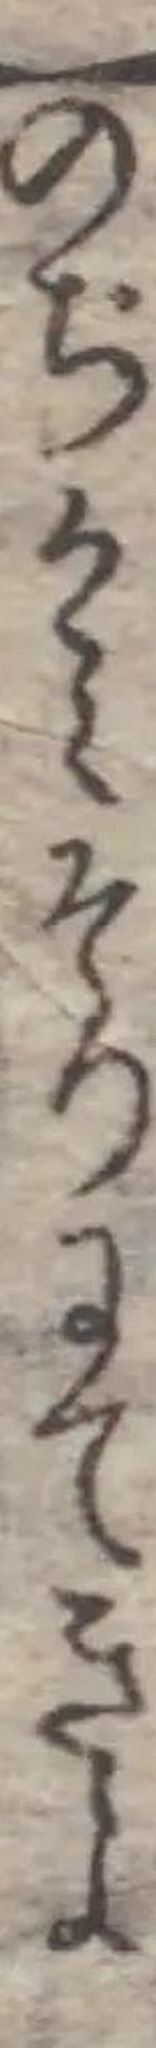のぢかみそりにてきよ
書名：五たいそう
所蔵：国立国会図書館 National Diet Library, JAPAN
